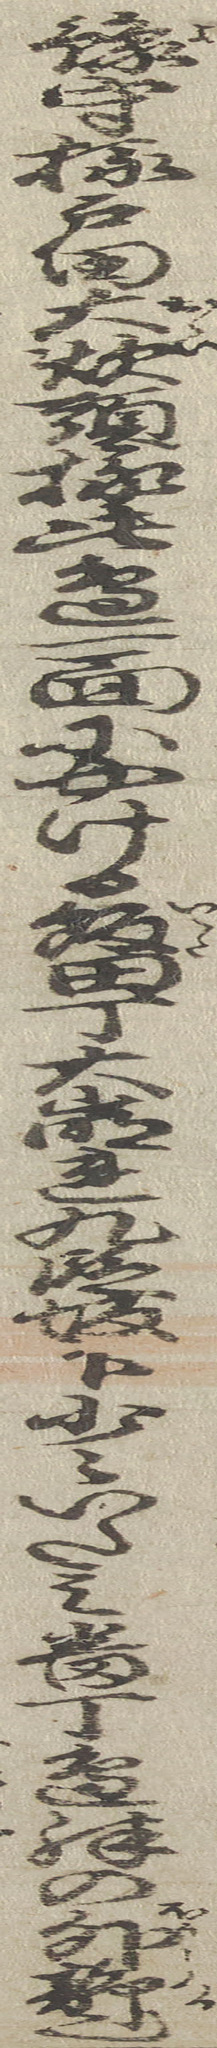豫守様戸田大炊頭様此邊一面にやける飯田丁大崩れ九段坂下少〻いたミ番丁邊殊の外静也
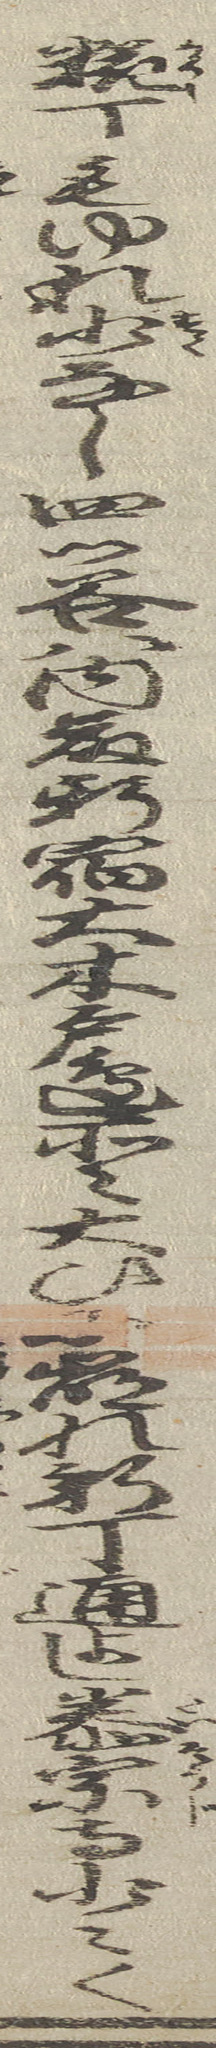糀丁もゆれ少なし四ツ谷ハ内藤新宿大木戸邊所〻大ひに崩れ新丁通よし泰宗寺少〻く
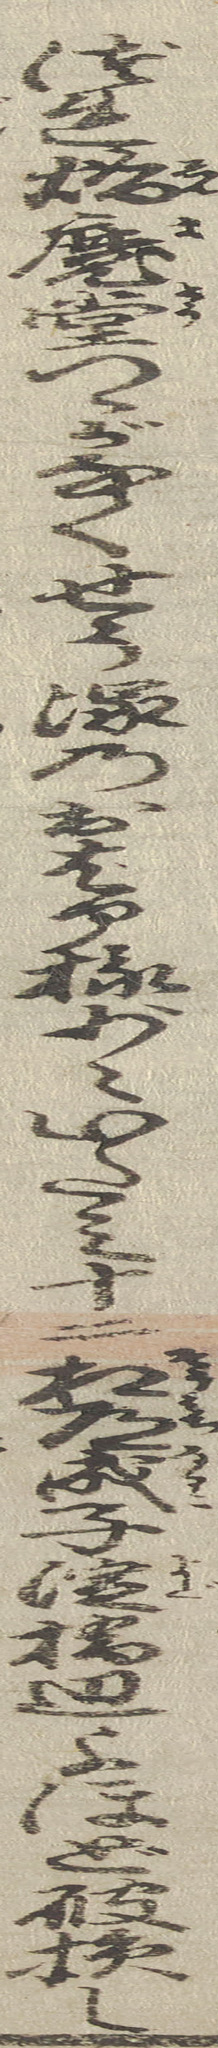づれ焔魔堂つゝがなくせう塚乃おはア様少〻いたミ十二相道成子淀橋辺よほど破損し
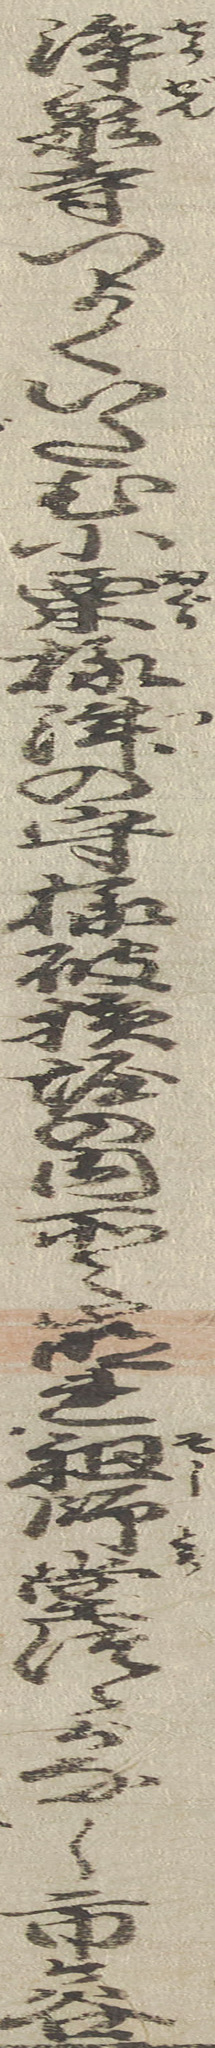浄泉寺つよくいたむ小栗様津の守様破損堀の内所〻くずれ祖師堂つゝがなし市ヶ谷
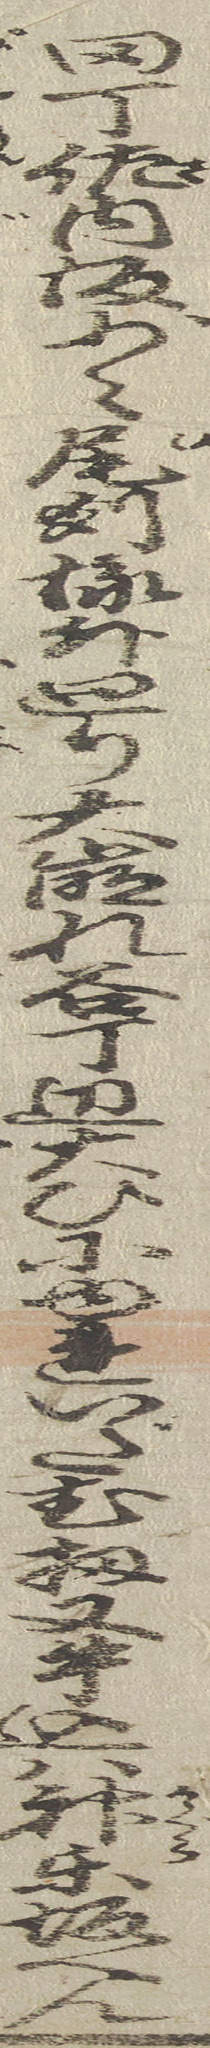田丁佐内坂少〻尾州様外廻り大崩れ谷丁辺大ひにゆれいたむ扨又牛込ハ神楽坂へん
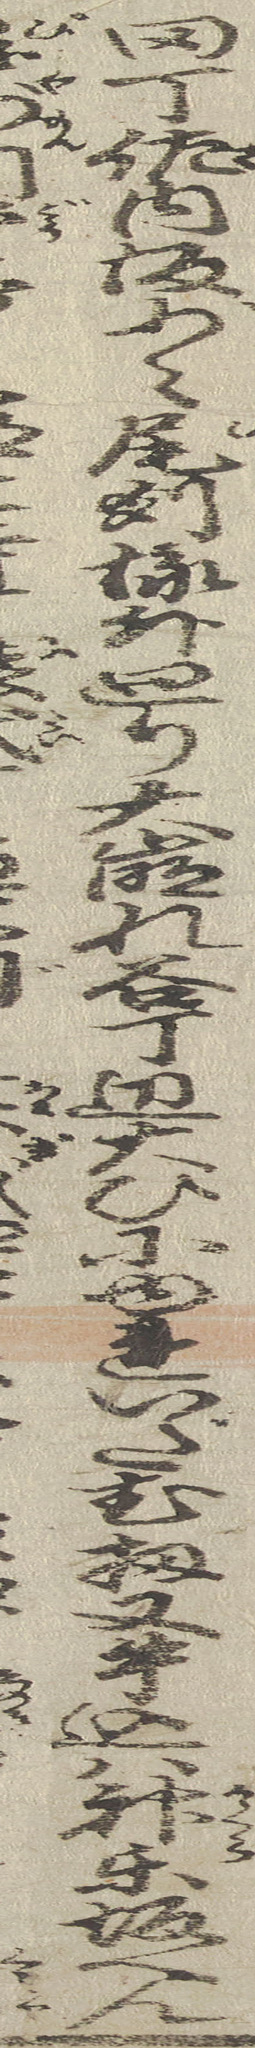田丁佐内坂少〻尾州様外廻り大崩れ谷丁辺大ひにゆれいたむ扨又牛込ハ神楽坂へん
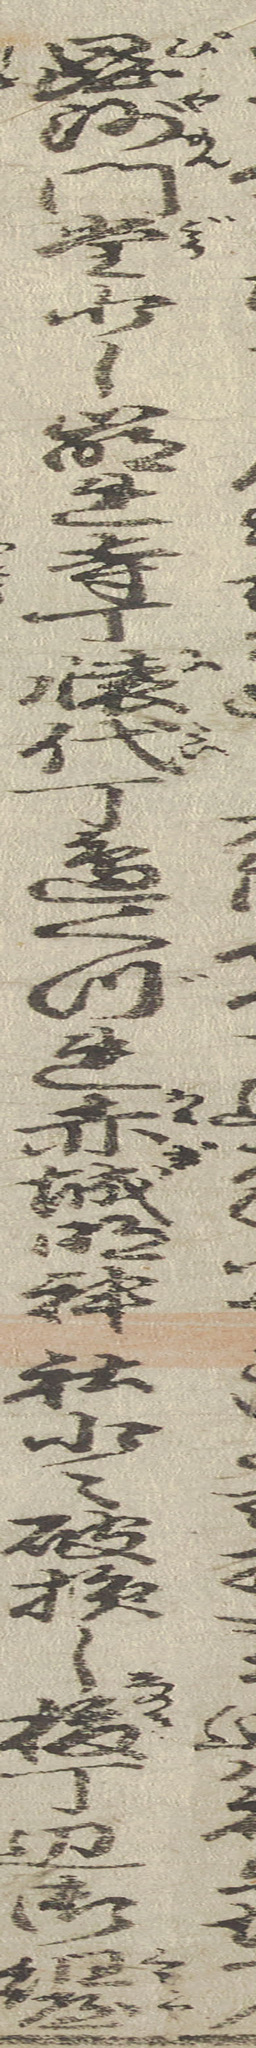毘沙門堂少し崩れ寺丁懐代丁邊くづれ赤城明神社少〻破損し榎丁辺御組屋
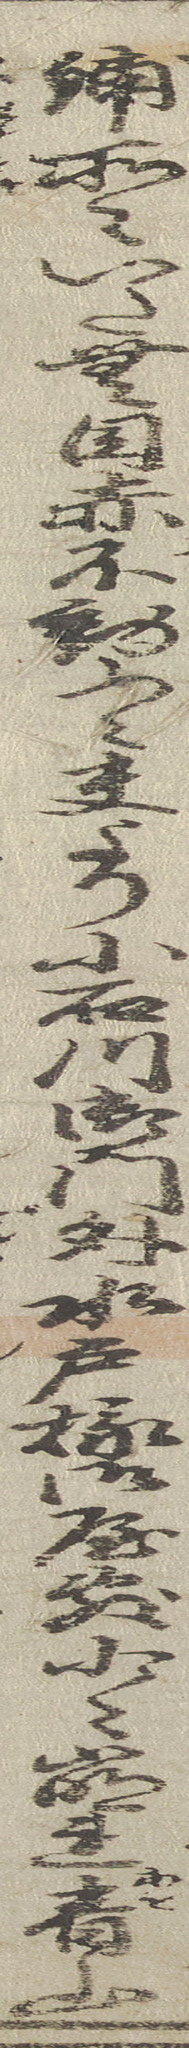鋪所〻いたむ目赤不動少〻夫より小石川御門外水戸様御屋敷少〻崩れ青山
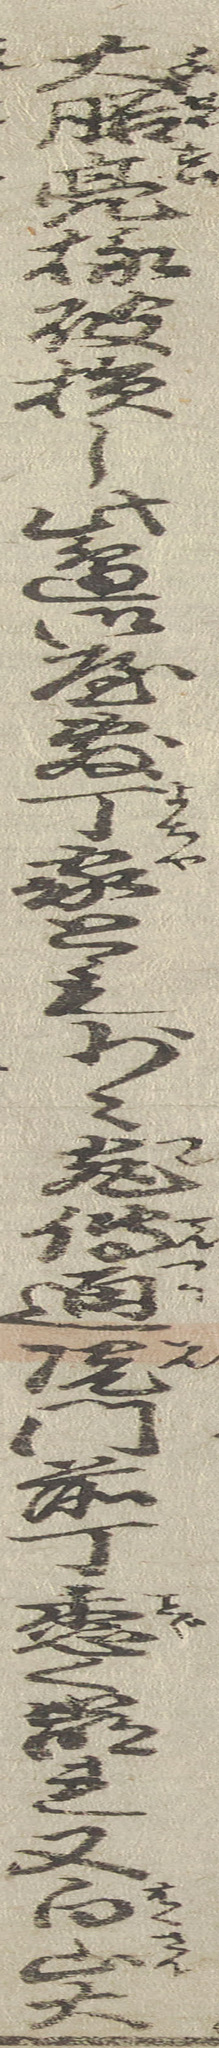大膳亮様破損し此邊御屋敷丁家とも少〻宛傳通院門前丁悉く崩れ又白山大
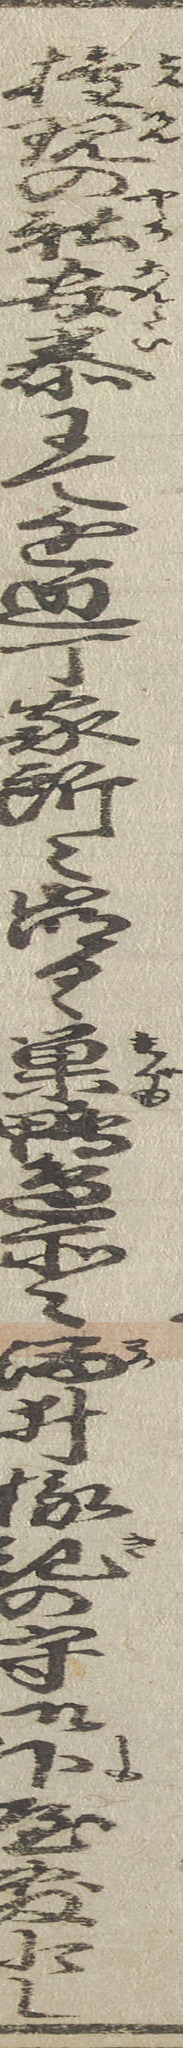権現の社安泰にて近辺丁家所〻崩るゝ巣鴨邊所〻酒井様紀の守御下屋敷少し
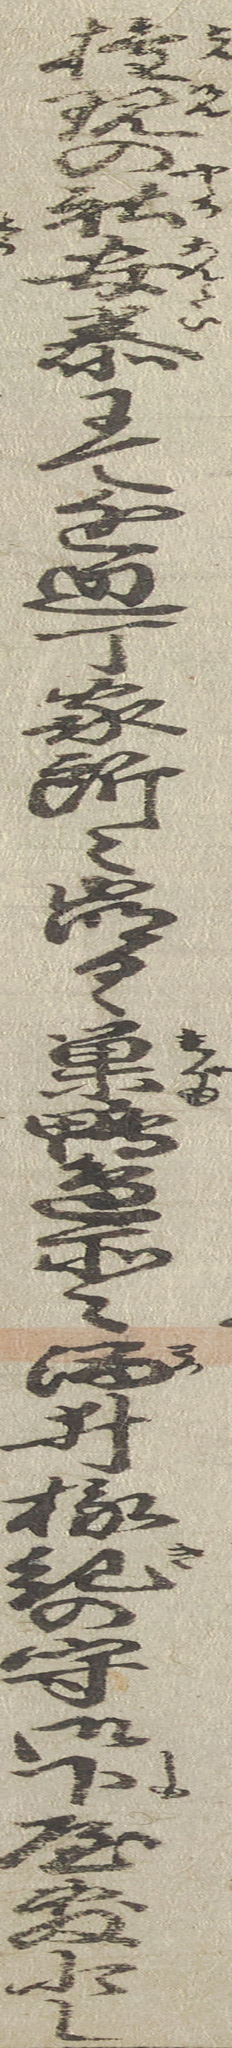権現の社安泰にて近辺丁家所〻崩るゝ巣鴨邊所〻酒井様紀の守御下屋敷少し
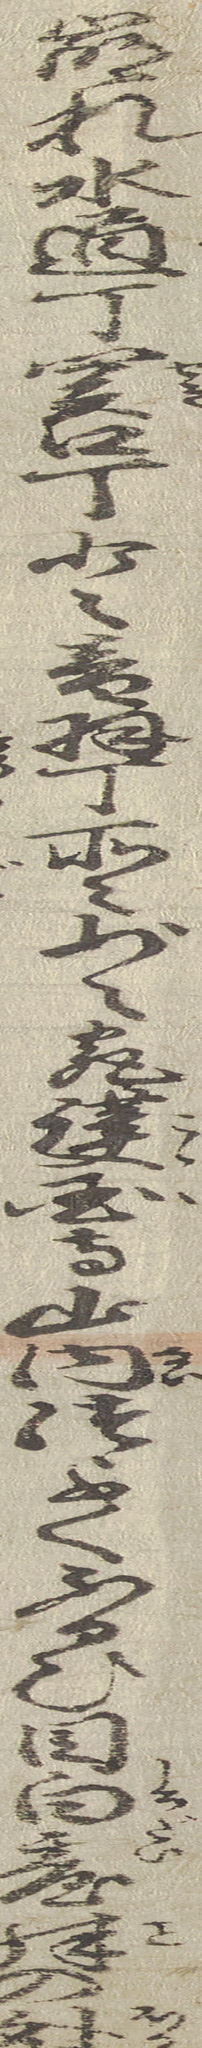崩れ水道丁関口丁少〻音羽丁所〻少〻宛護国寺山内つよくふるひ目白臺殊の外
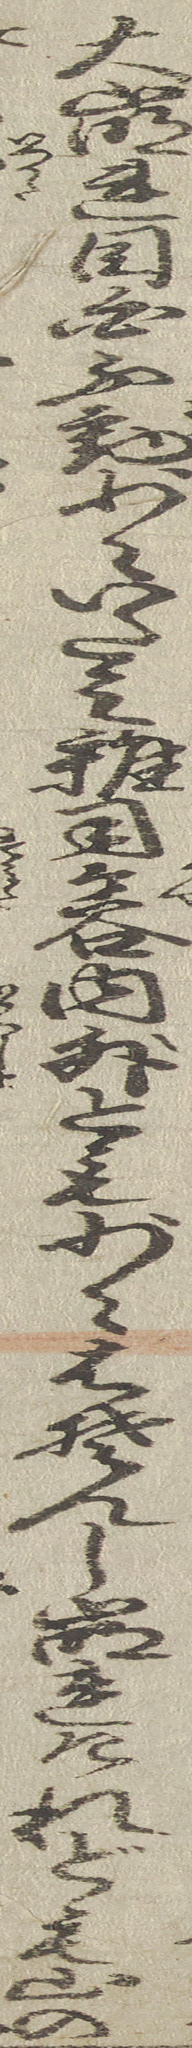大崩れ目白不動少〻いたミ雑司ヶ谷内外とも少〻はそんし崩れけれども山の
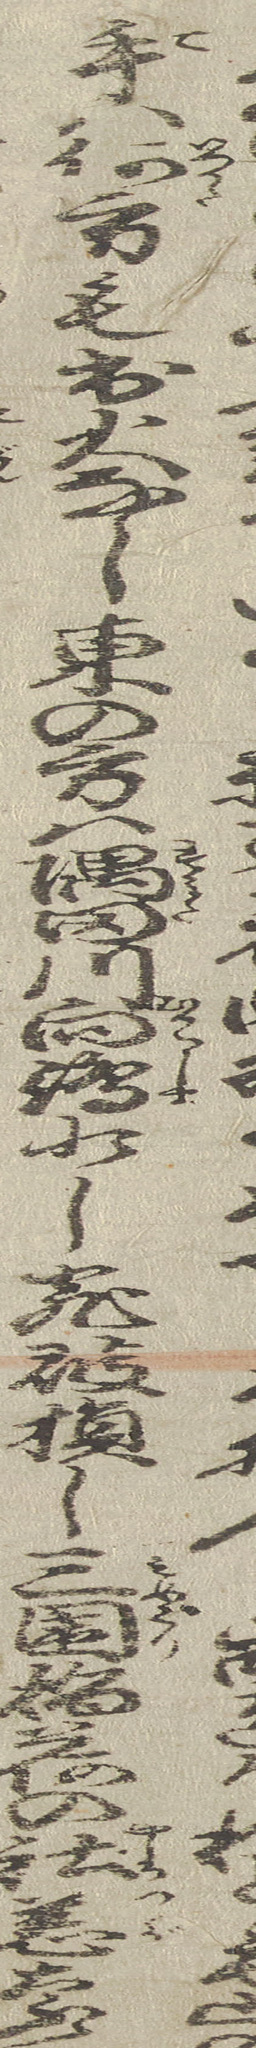手ハ何方も出火なし東の方ハ隅田川向嶋少し宛破損し三圍稲荷の社恙なく
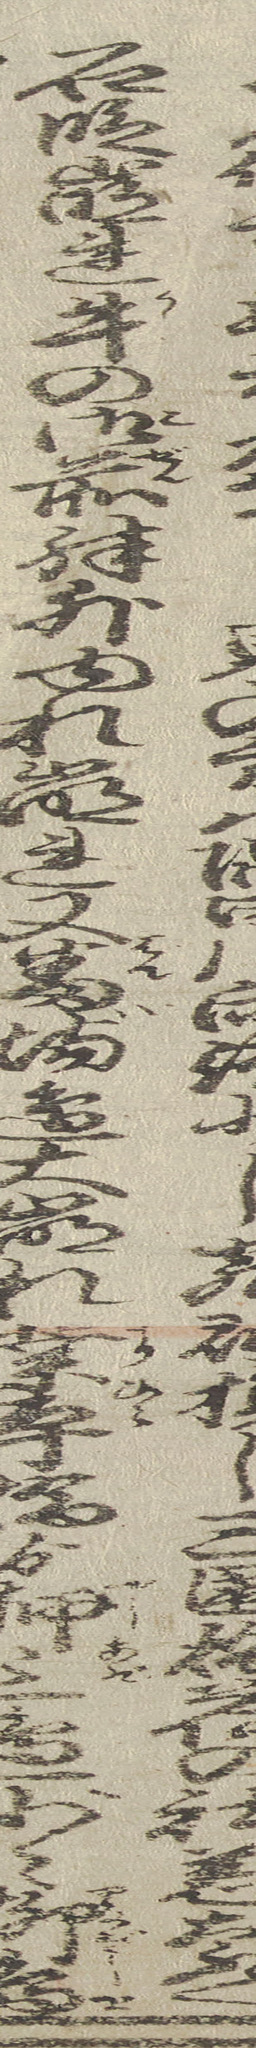石段崩れ牛の御膳殊外ゆれ崩れ又番場邊大崩れ業平橋ゟ押上邊少〻柳島
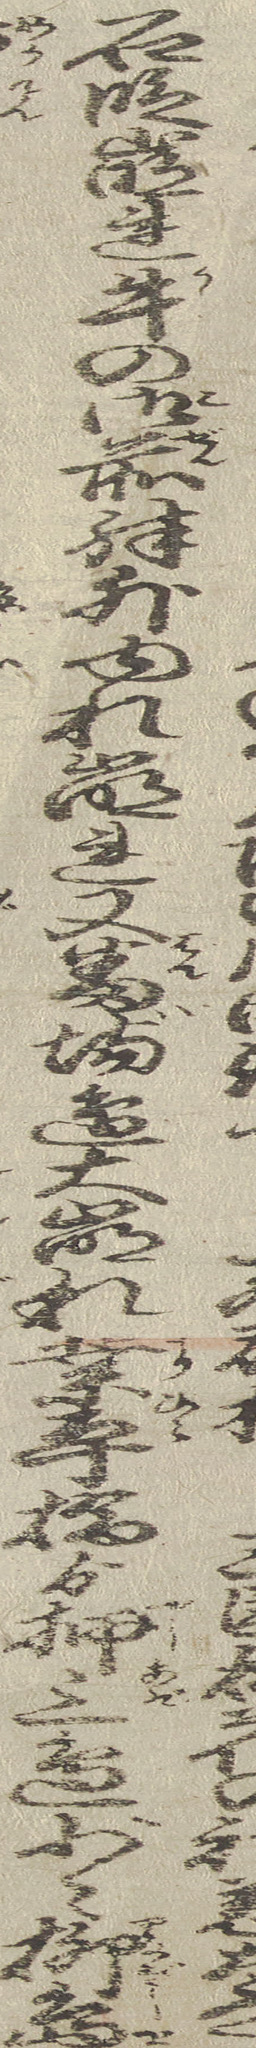石段崩れ牛の御膳殊外ゆれ崩れ又番場邊大崩れ業平橋ゟ押上邊少〻柳島
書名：ゆるがぬ御代要之石寿栄
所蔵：東京大学総合図書館 General Library in the University of Tokyo, JAPAN
